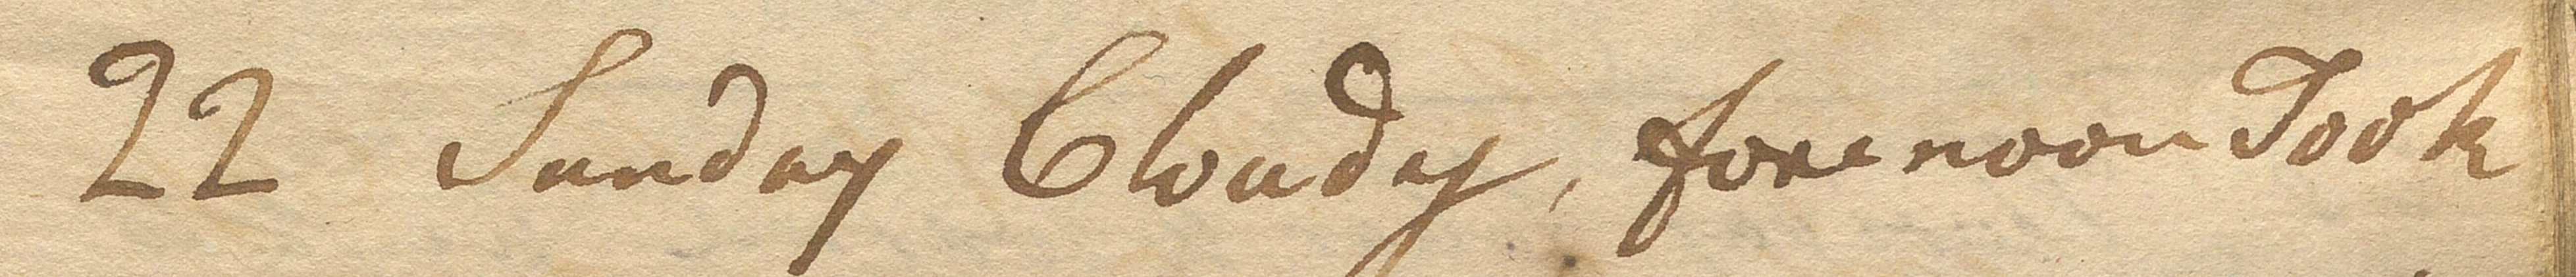22^th Sunday Cloudy, forenoon Took
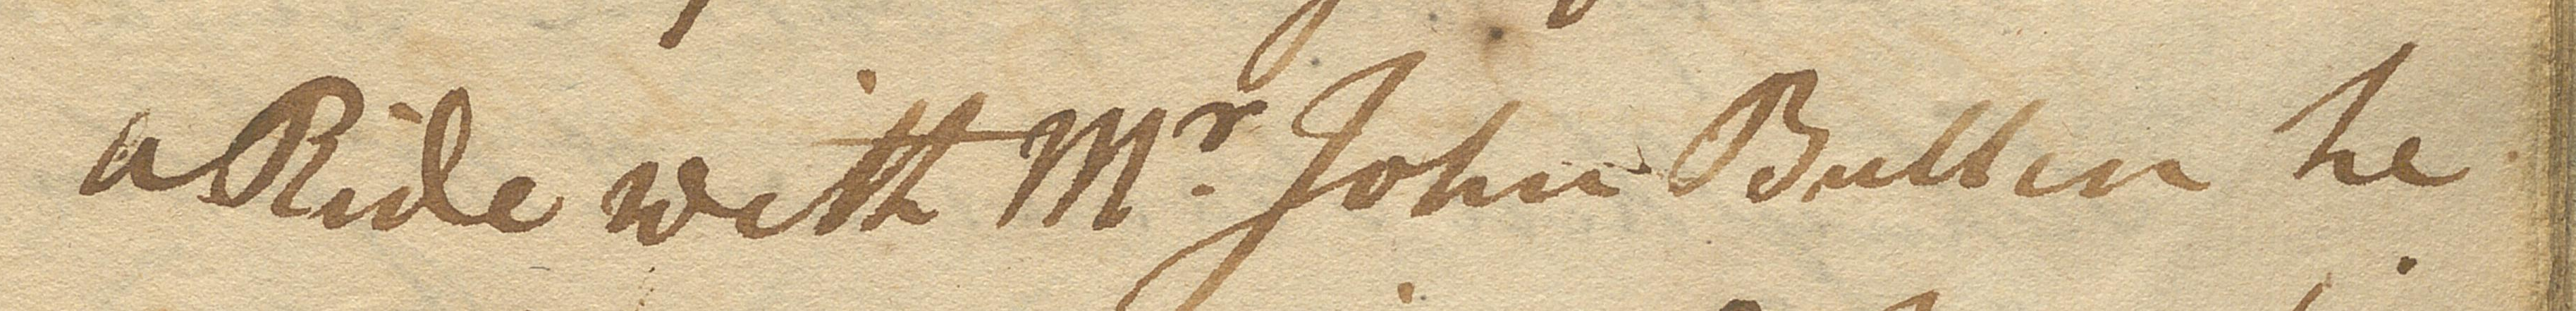a Ride with M^r. John Bullin he
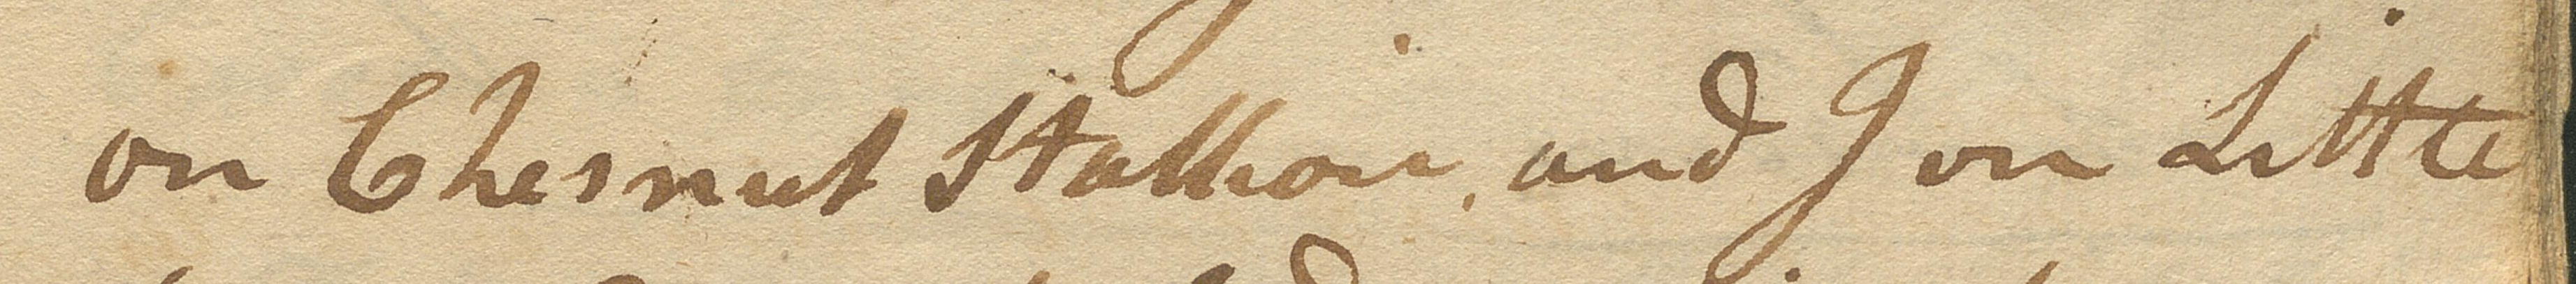on Chesnut Stallion, and I on Little
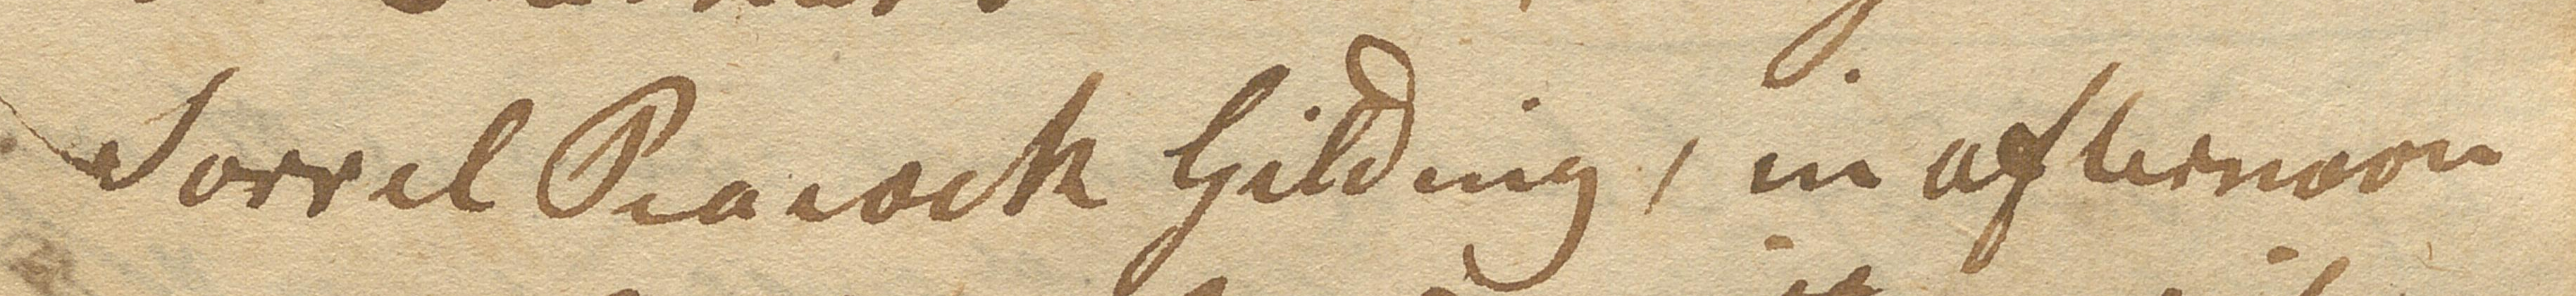Sorrel Peacock Gilding, in afternoon
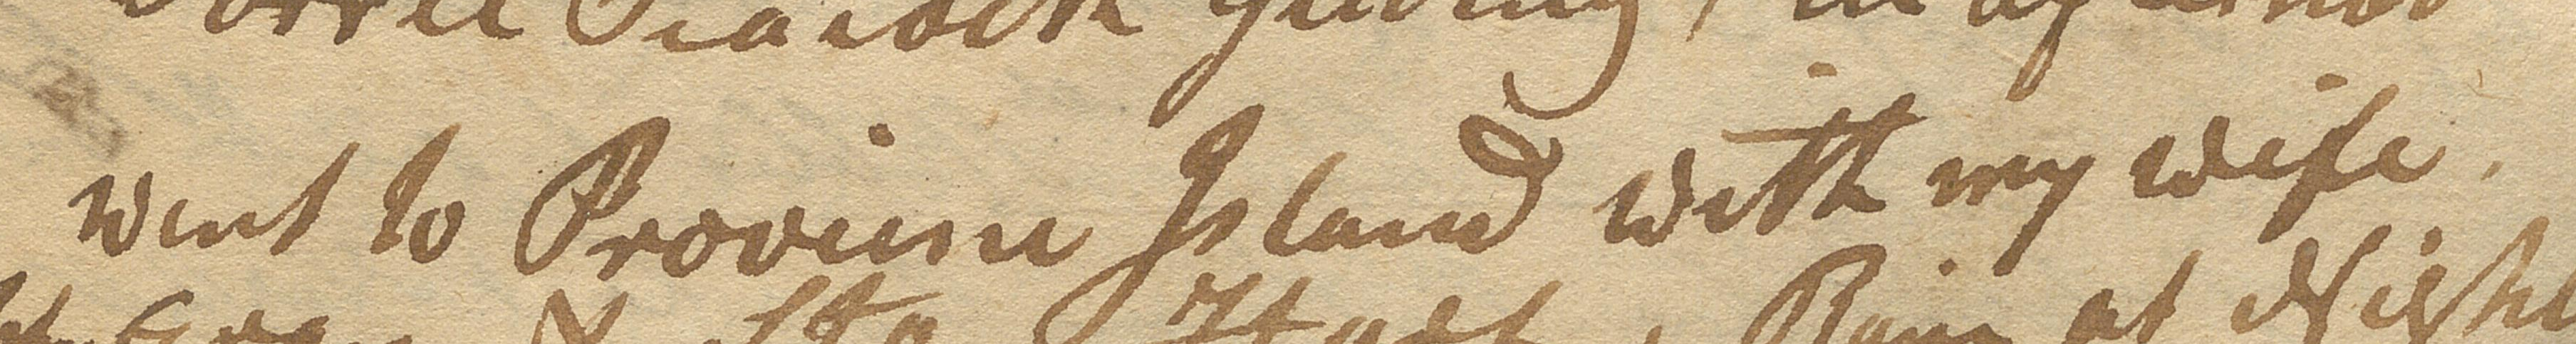went to Proveine Island with my wife.
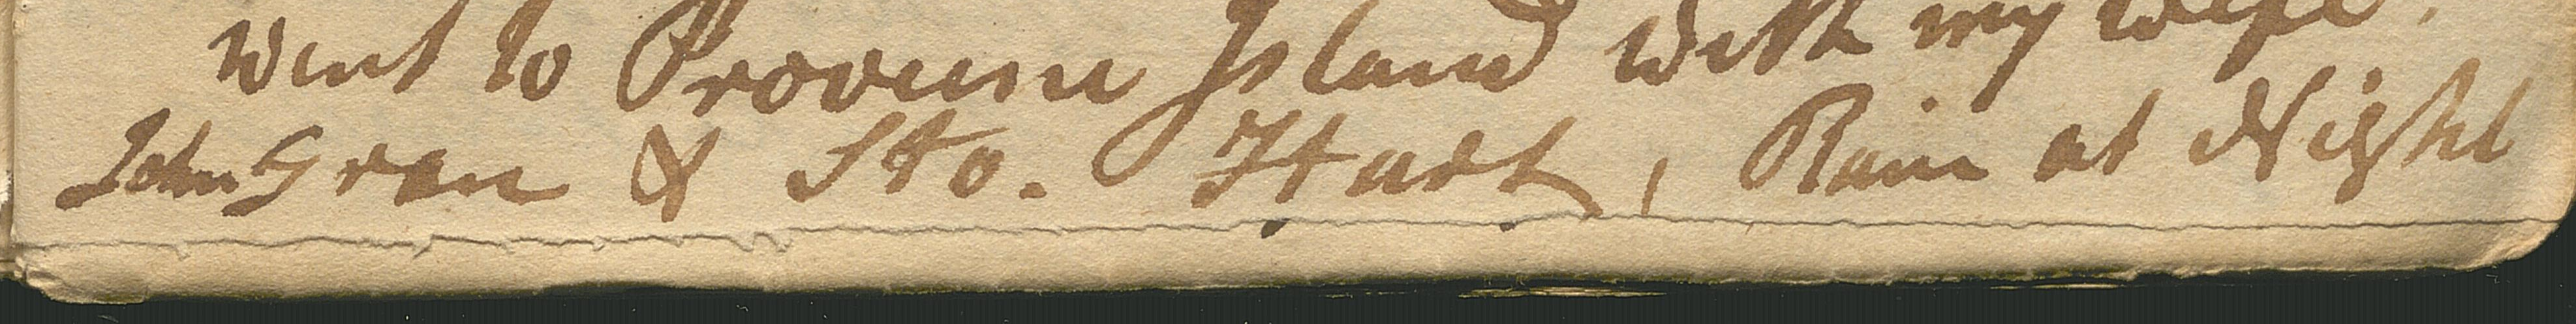John Grau & Sto. Hart, Rain at Night
